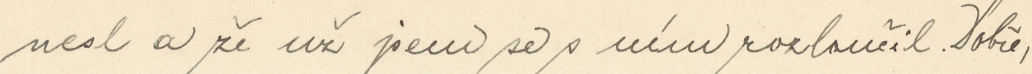nesl a že už jsem se s ním rozloučil. Dobře,
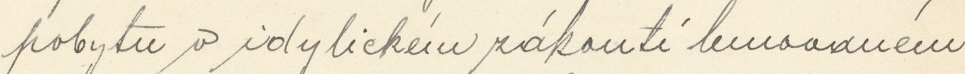pobytu v idylickém zákoutí lemovaném
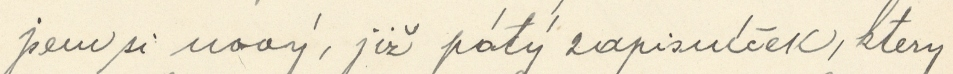jsem si nový, již pátý zapisníček, který
